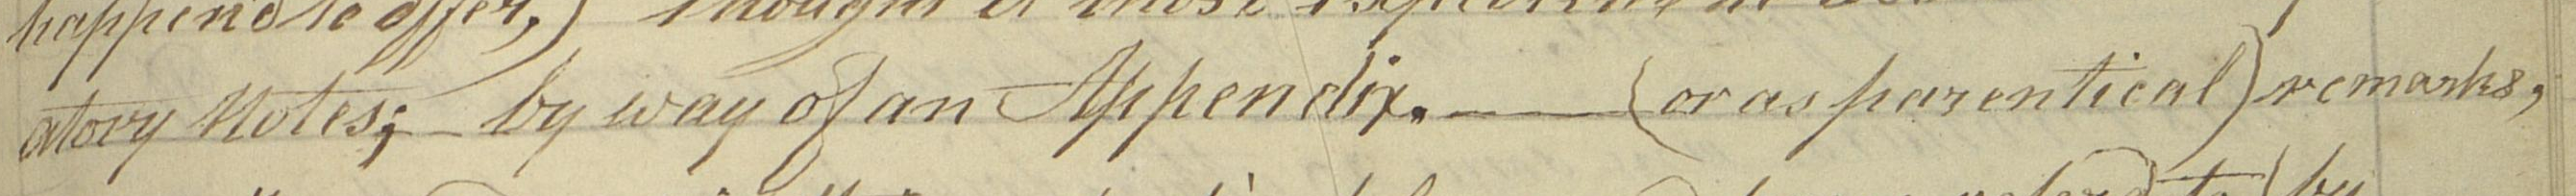-atory Notes; by way of an Appendix. (or as parentical) remarks,
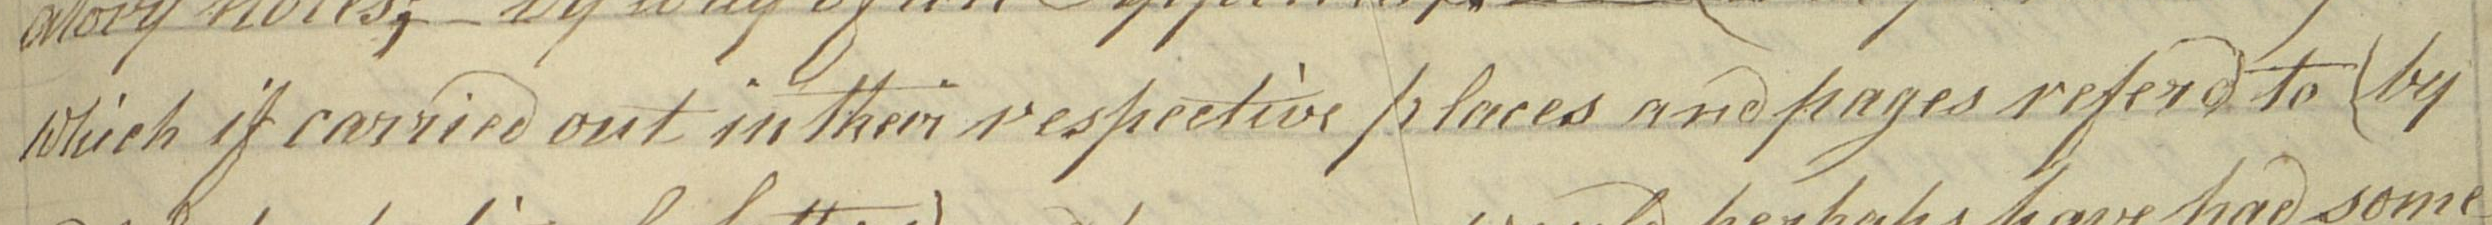which if carried out in their respective places and pages refered to (by
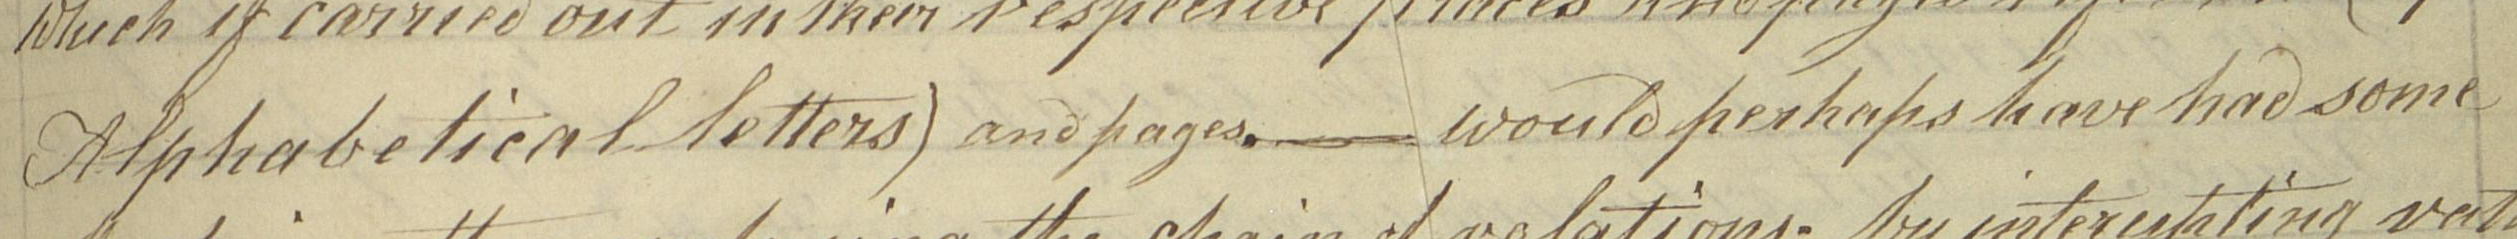Alphabetical letters) and pages. would perhaps have had some
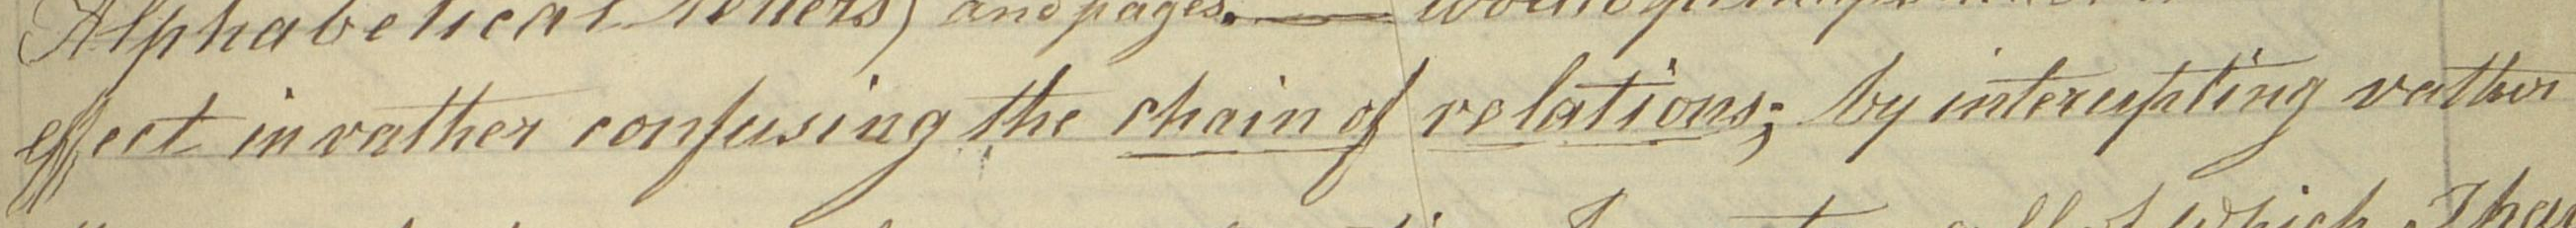effect in rather confusing the chain of relations; by interupting rather
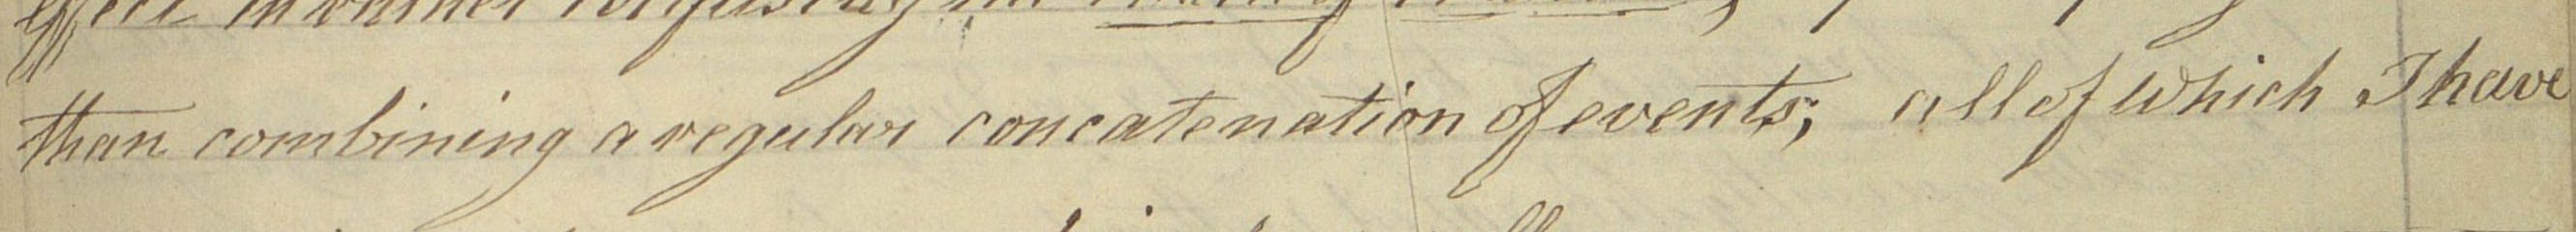than combining a regular concatenation of events, all of which I have
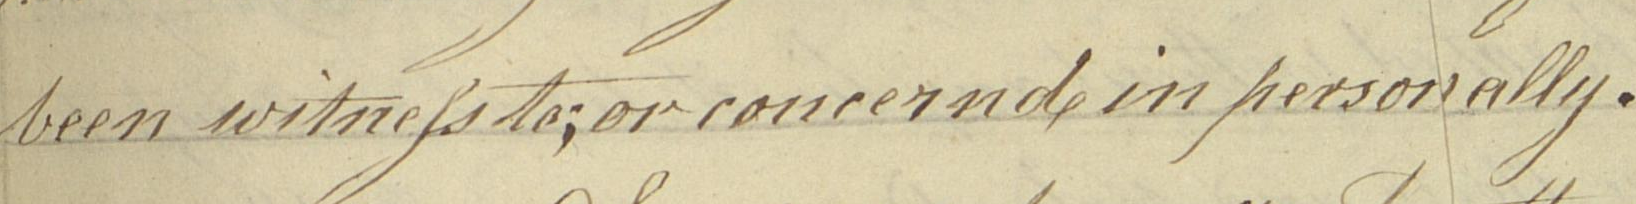been witness to; or concernd in personally.
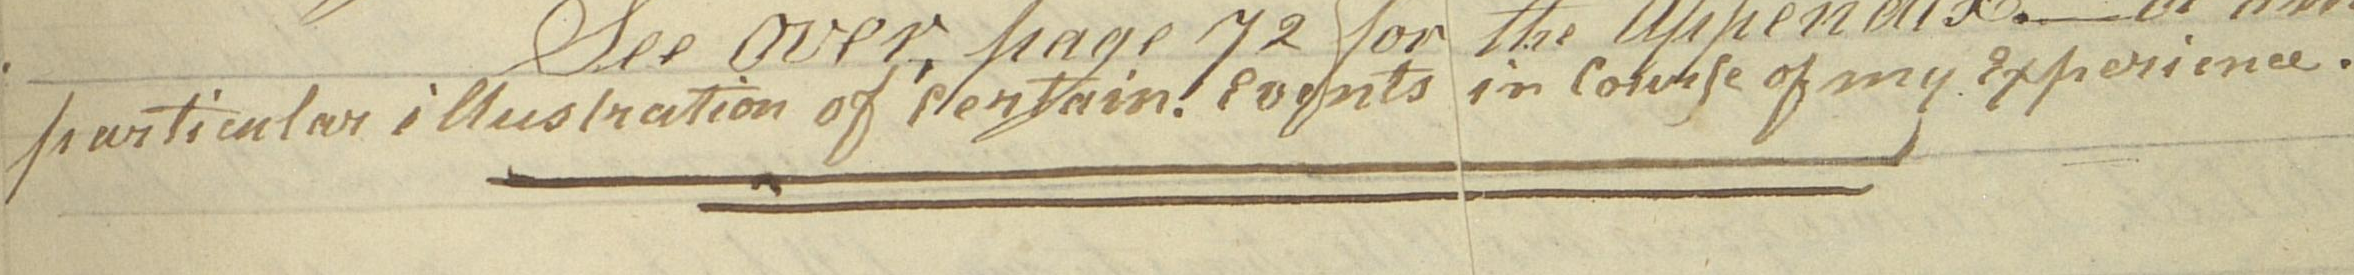particular illustration of certain Events in Course of my Experience.
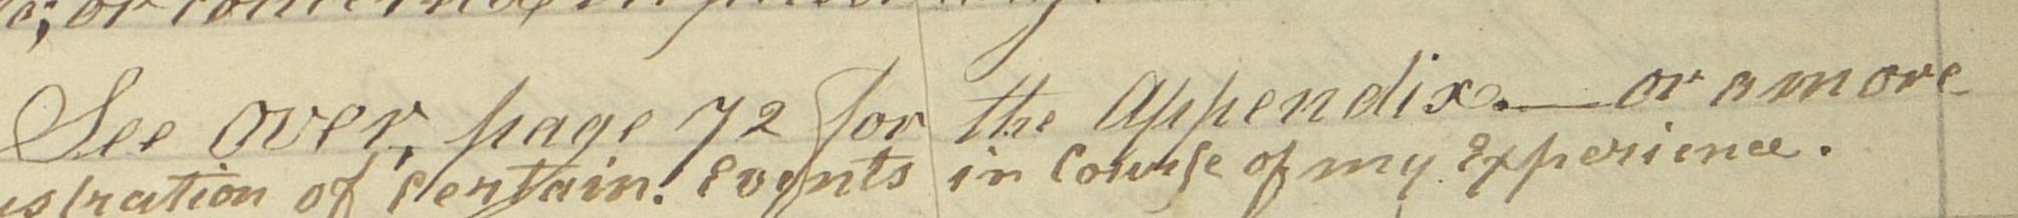See over page 72 for the Appendix or a more
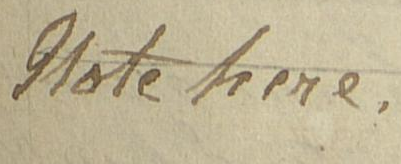Note here
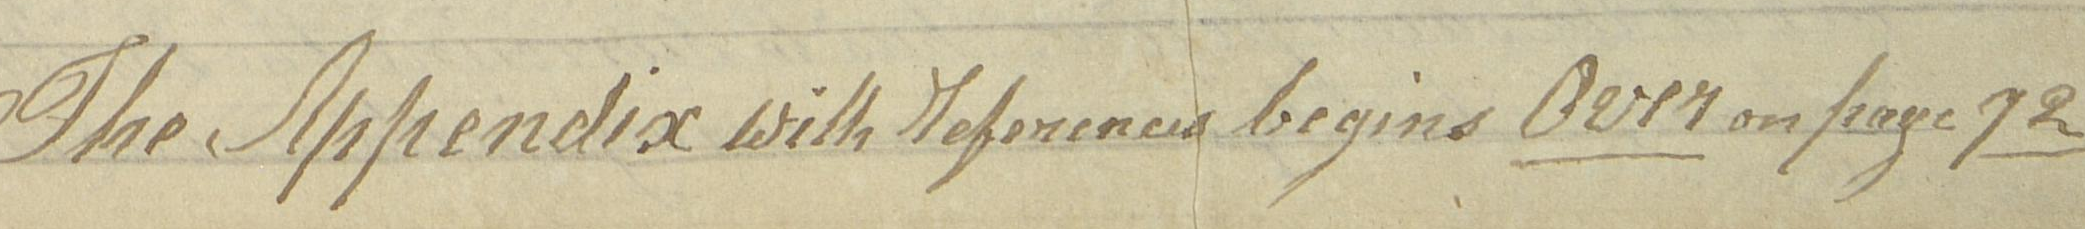The Appendix & With References begins Over on page 72
